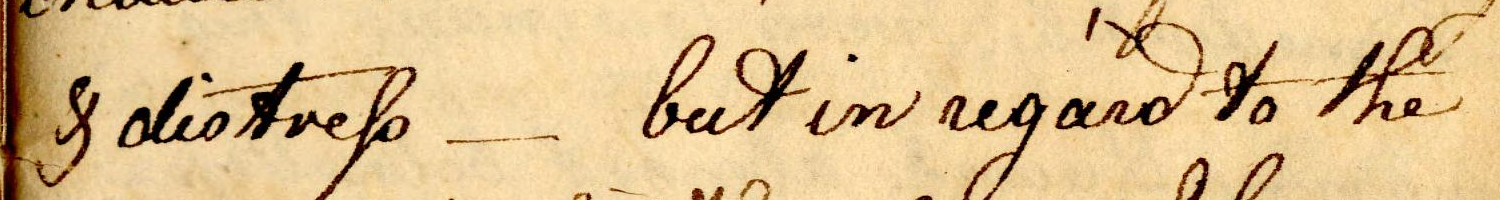& distress- but in regard to the
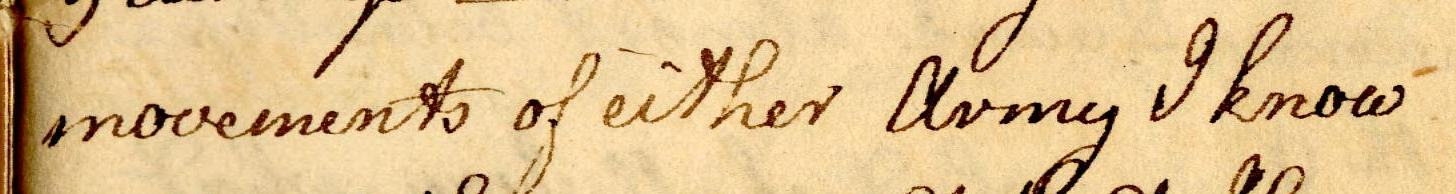movements of either Army I know
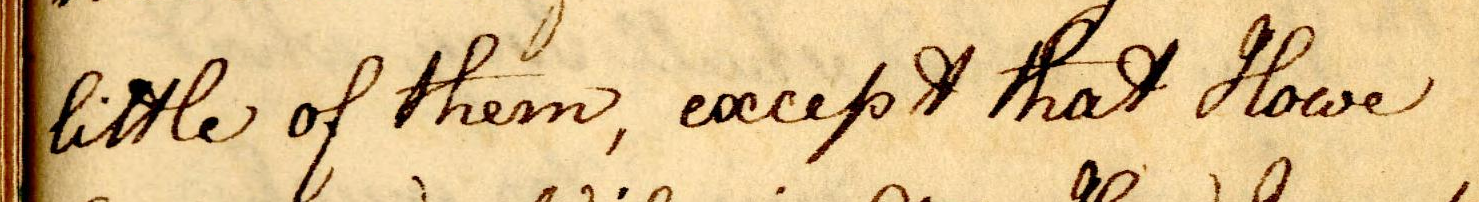little of them, except that Howe
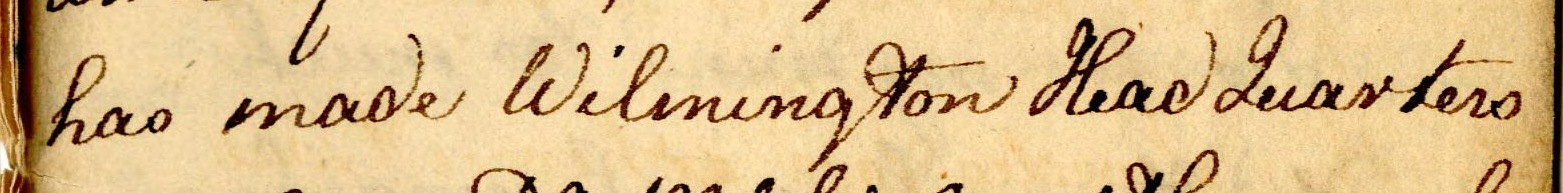has made Wilmington Head Quarters
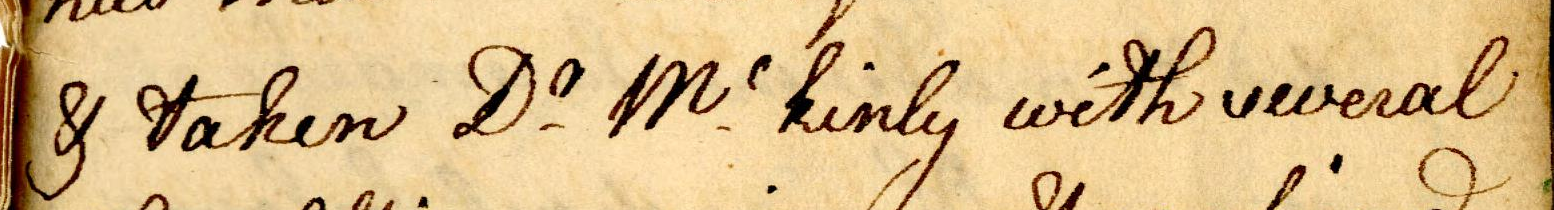& taken D^r M^c.kinly with several
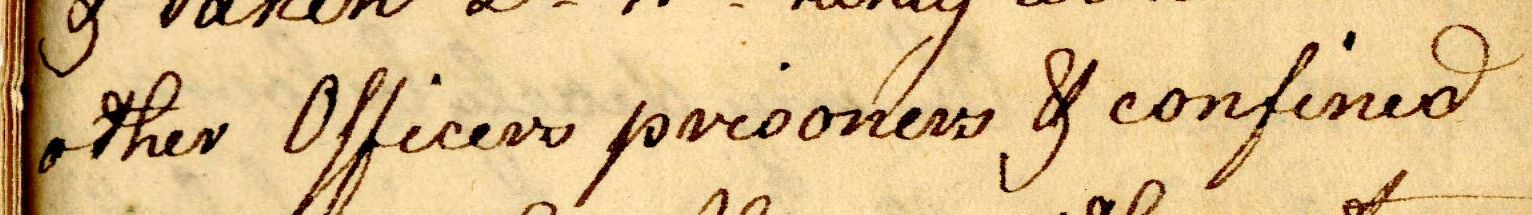other Officers prisoners & confined
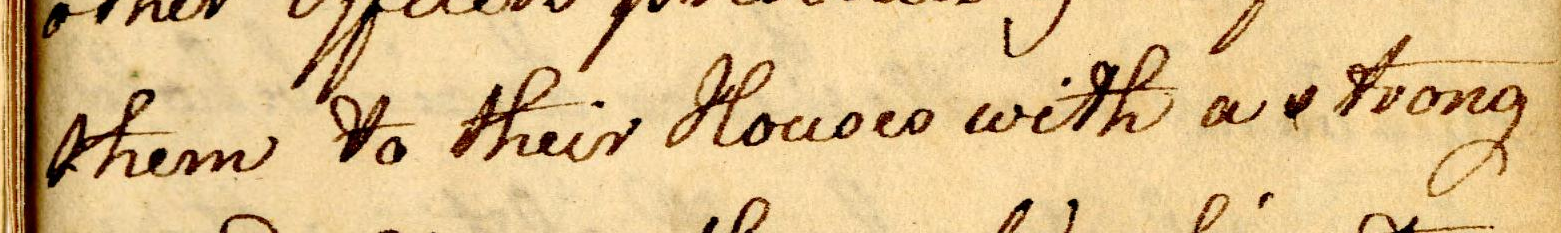them to their Houses with a strong
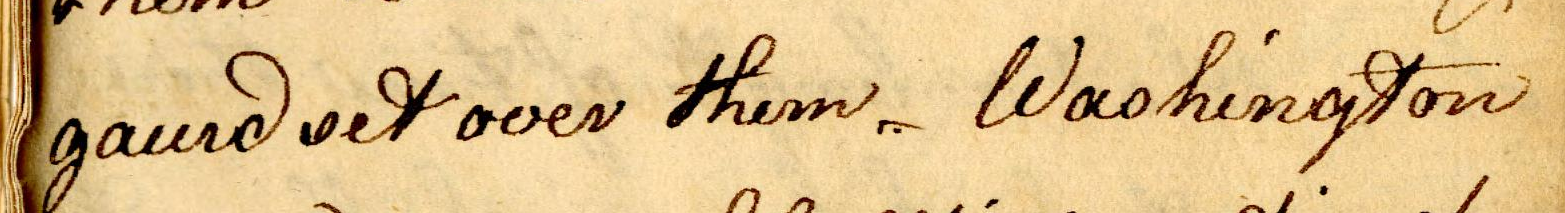gaurd set over them- Washington
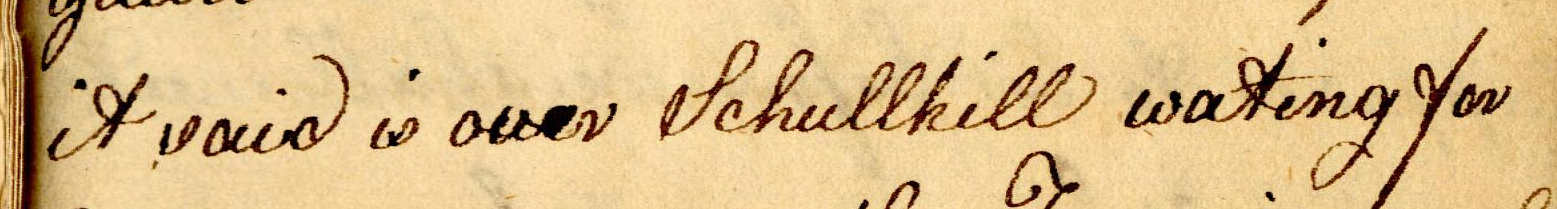it said is over Schullkill wating for
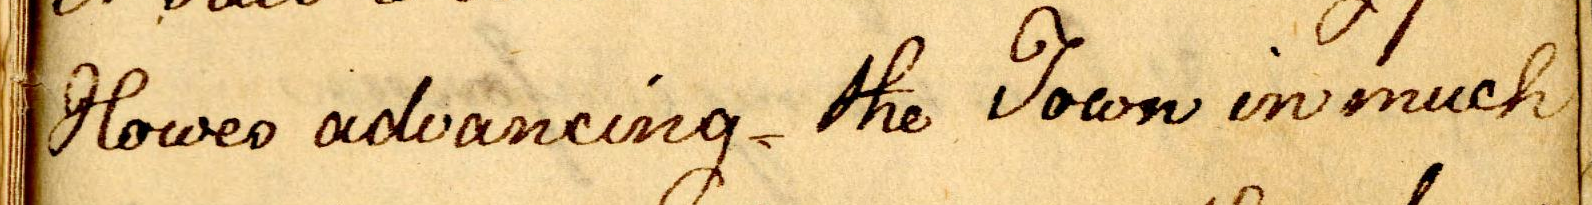Howes advancing- the Town in much
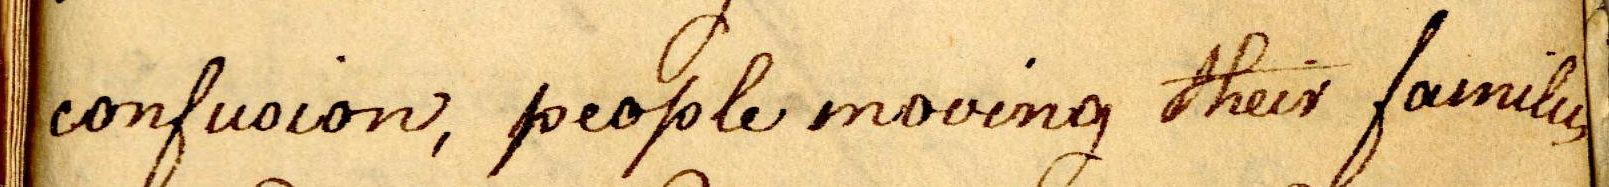confusion, people moving their family
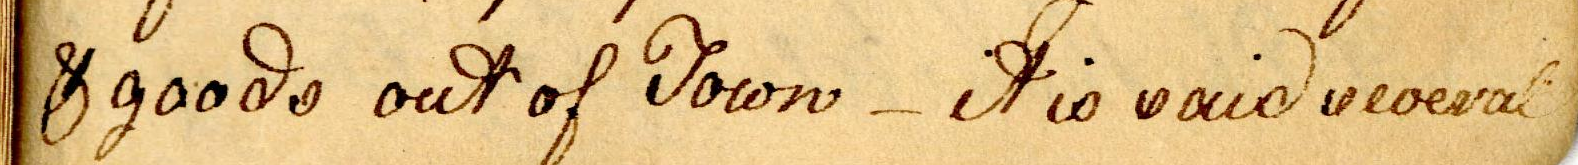& goods out of Town- it is said several
